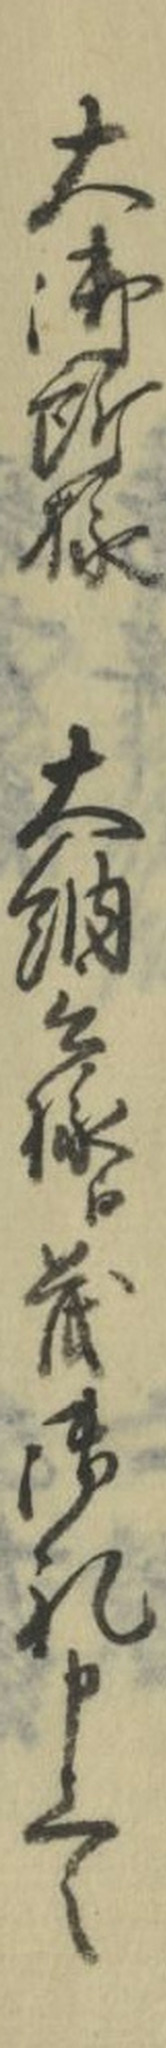大御所様大納言様えも御礼申上之
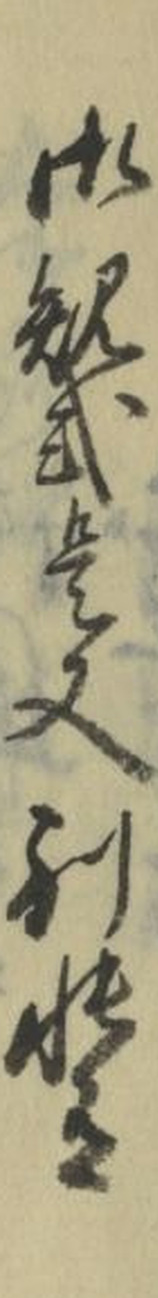御規式是又別帳有
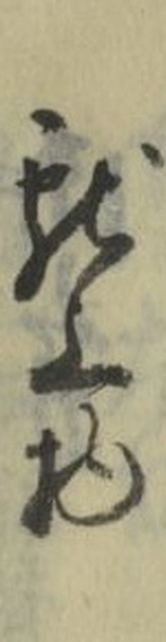献上物

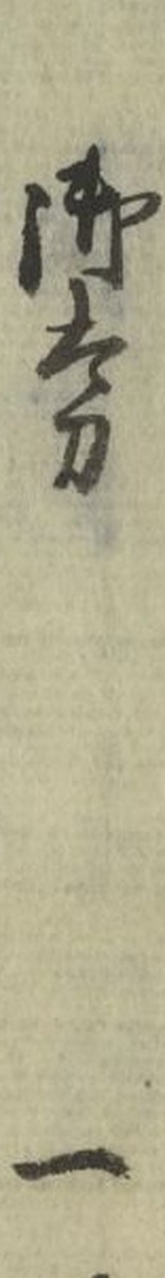御太刀一腰
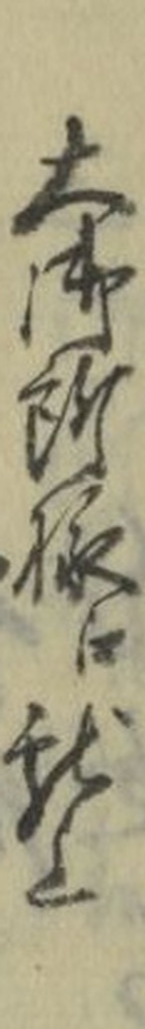大御所様え献上

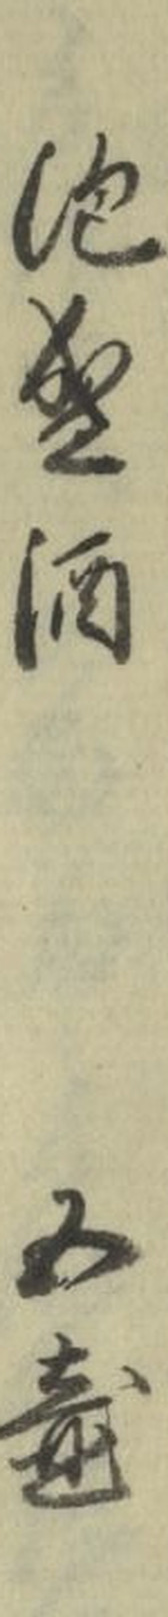泡盛酒五壺
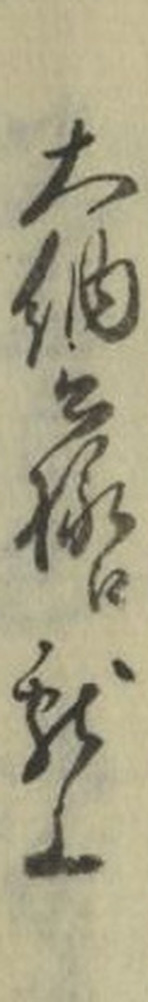大納言様え献上
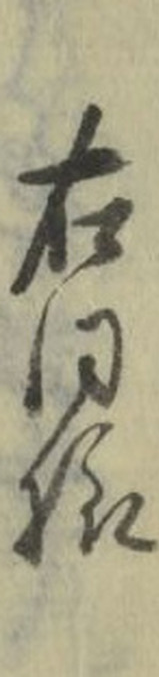右同様
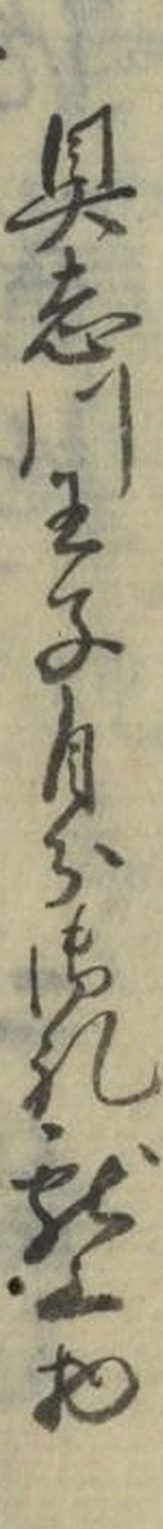具志川王子自分御礼献上物
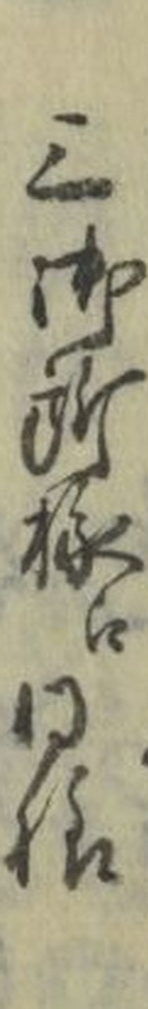三御所様え同様
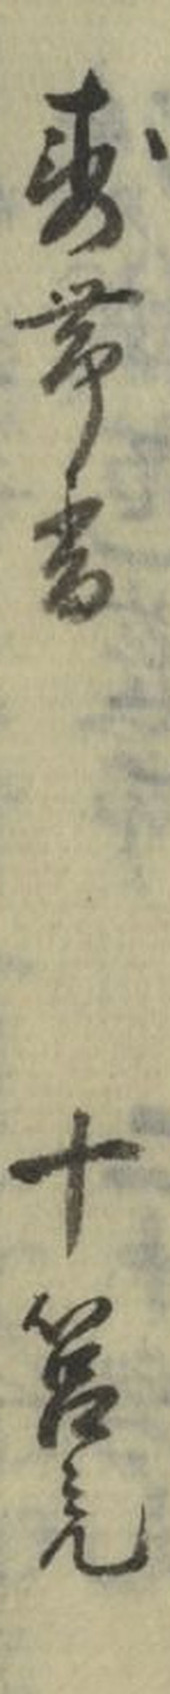寿帯香十筥宛
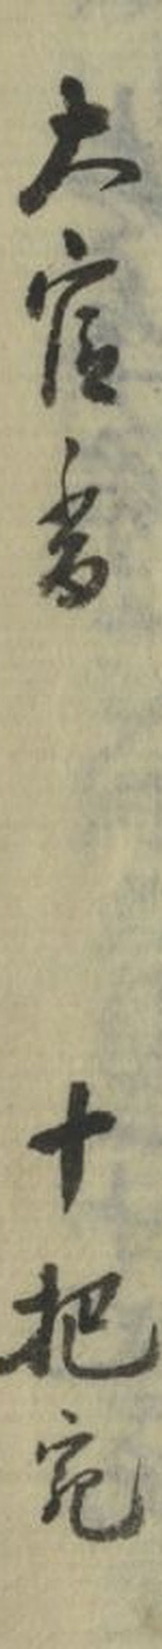大官香十把宛

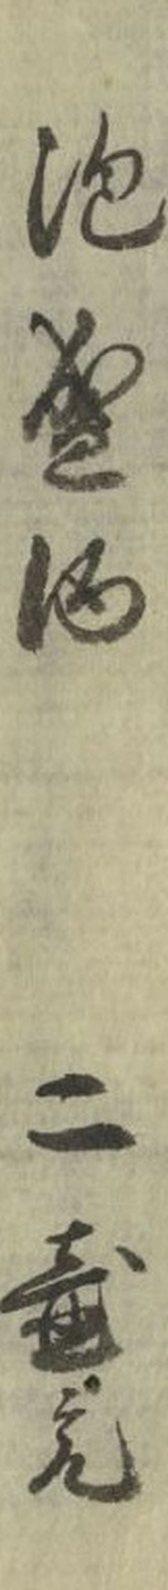泡盛酒二壺宛
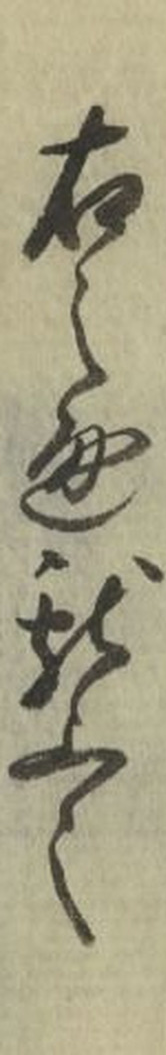右之通献上之
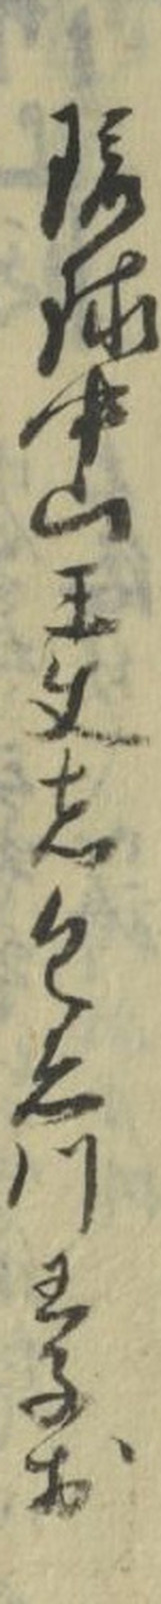琉球中山王使者具志川王子於
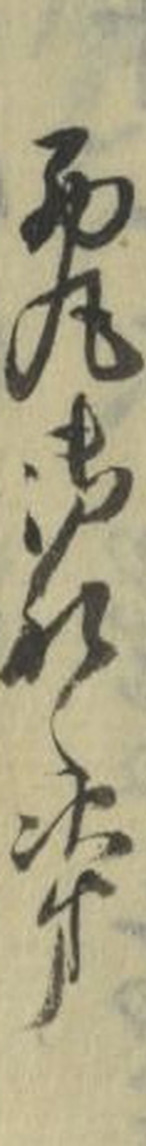西丸御礼之次第
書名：戊辰琉球人来朝之式 全
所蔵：University of the Ryukyus Library
